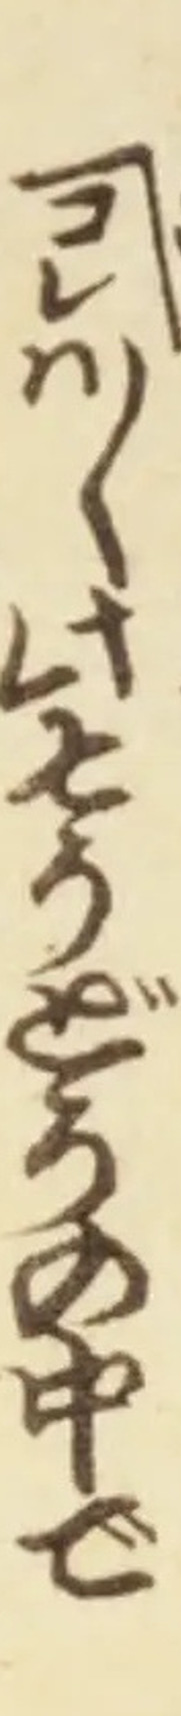〽コレハ〳〵此そうどうの中で
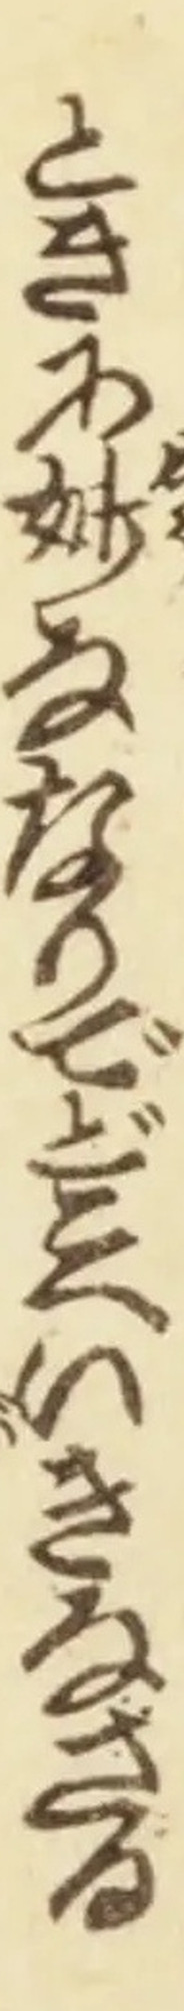ときに妙ななりでどこへいきなさる
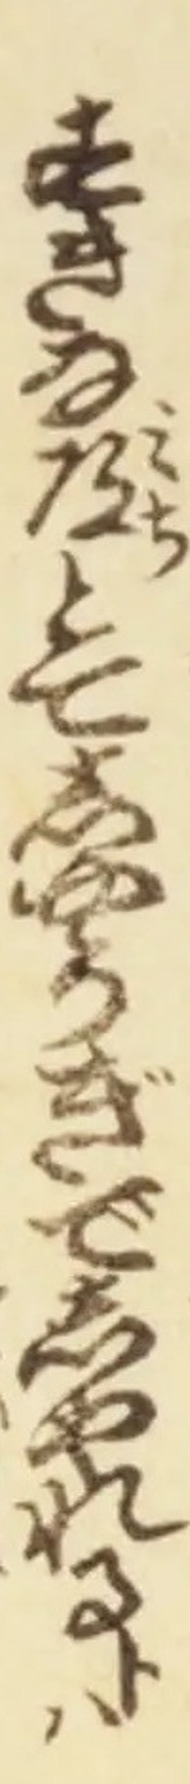すきな道とてしやうぎでしやれるトハ
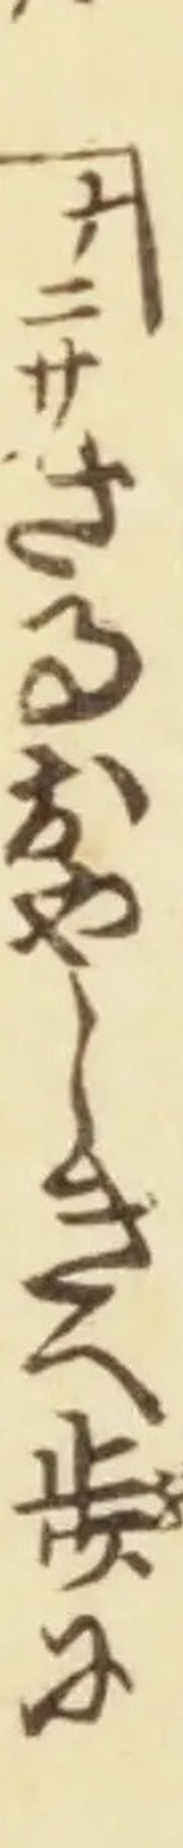〽ナニサさるおやしきへ歩に
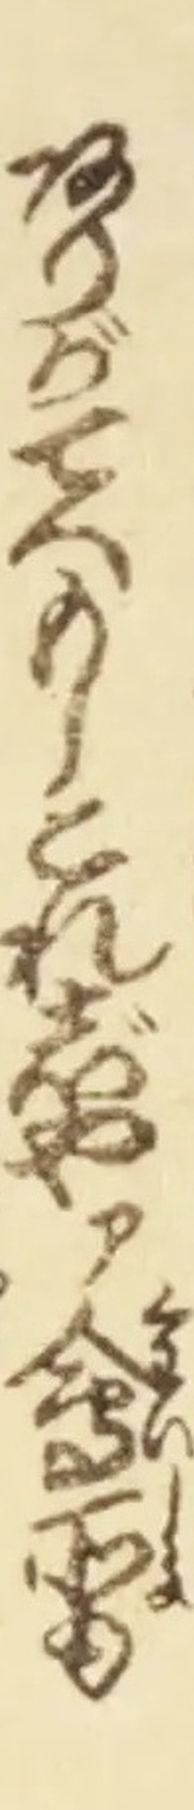ありがてへもしこれじやア会所も
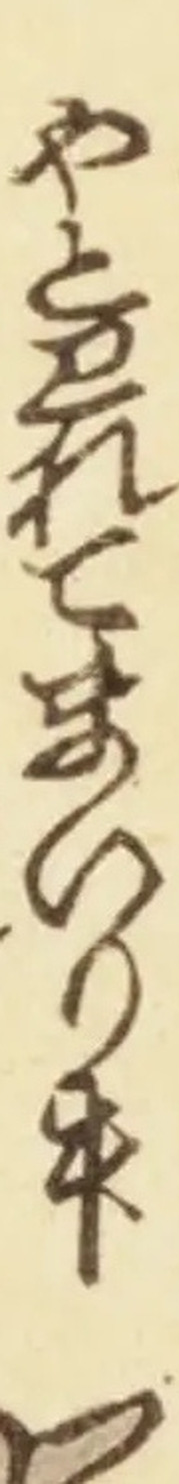やとわれてまいり升
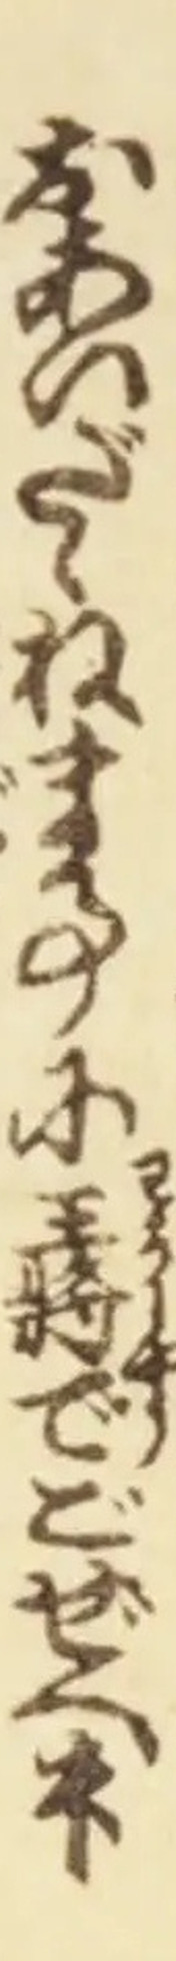おあいだゝねま事に王将でごぜへ升
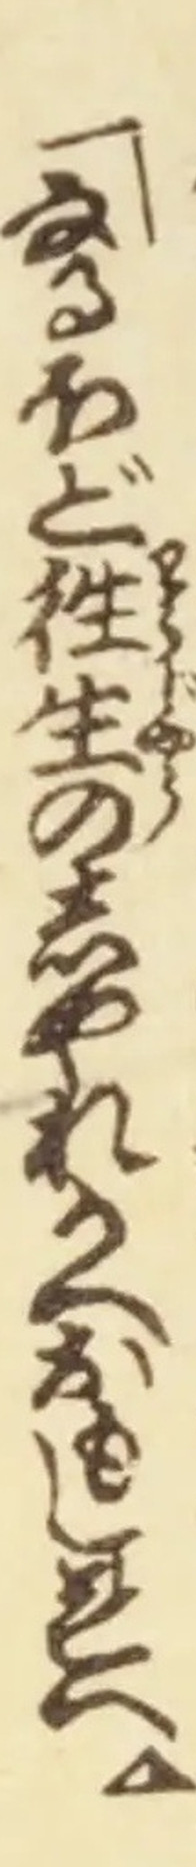〽なるほど往生のしやれかへおもしれへ△
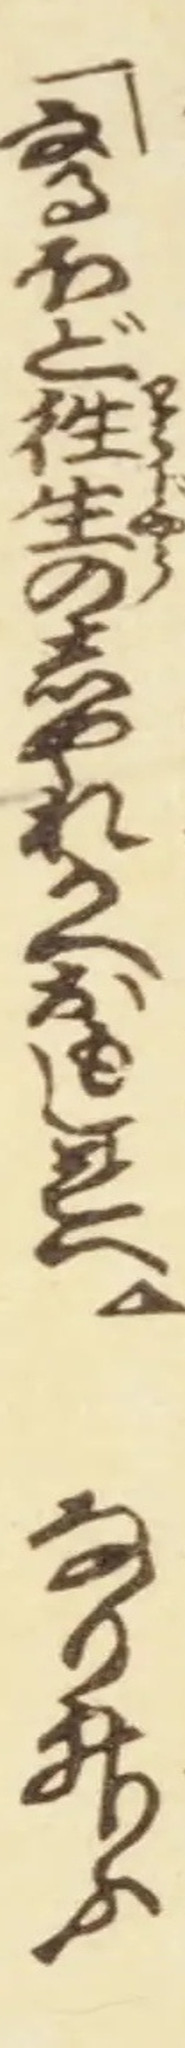〽なるほど往生のしやれかへおもしれへ△
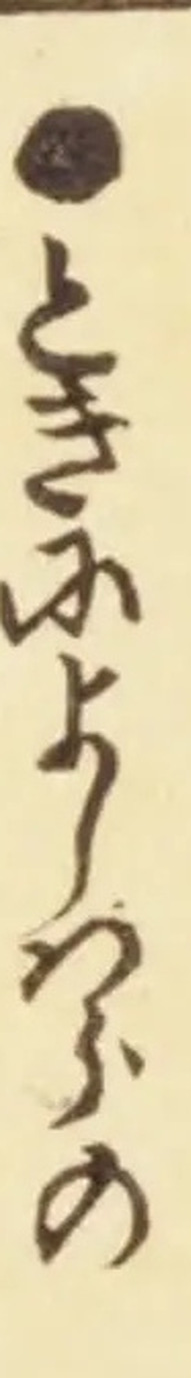●ときによしわらの
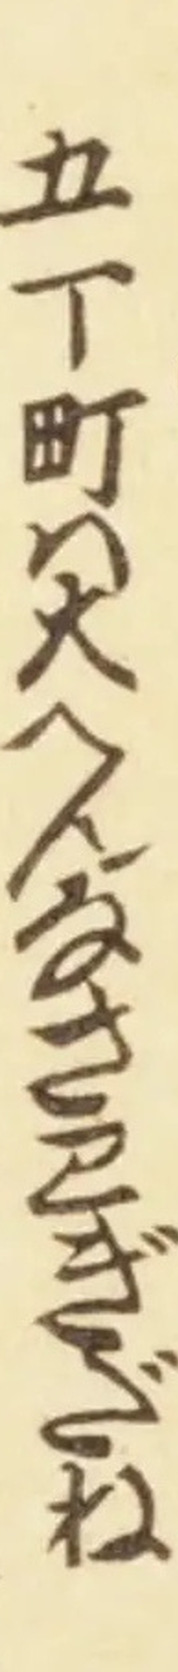五丁町は大へんなさわぎだね
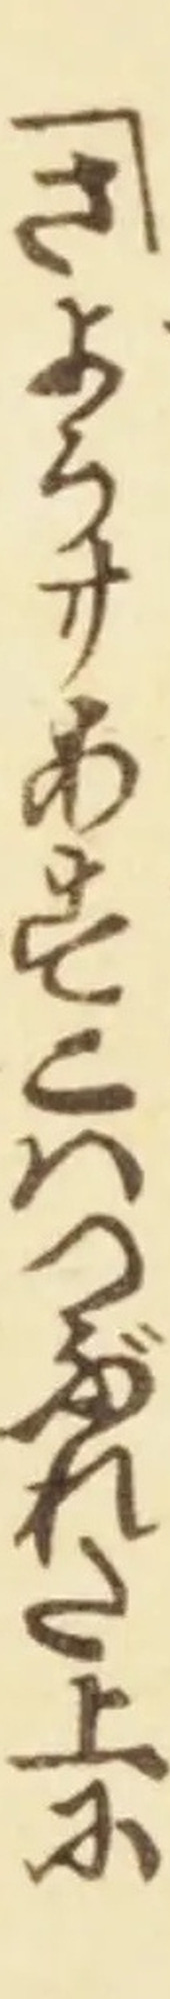〽さようサあすこはつぶれた上に
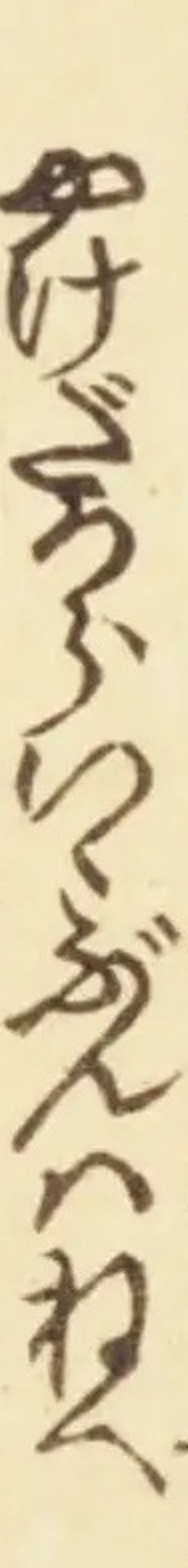やけだからいゝぶんはねへ
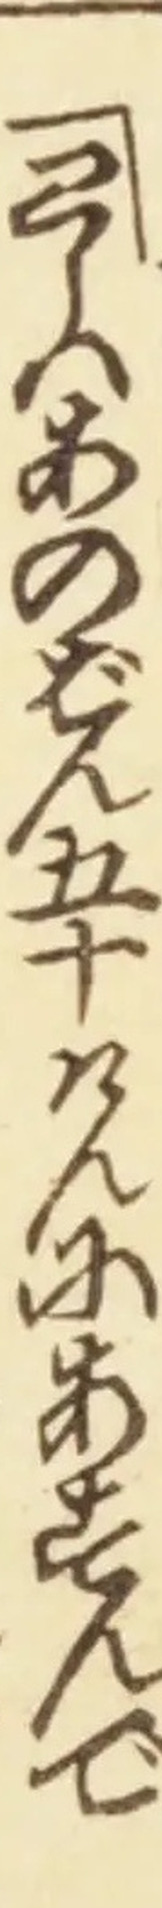〽わしはあのばん五十けんにあすんで
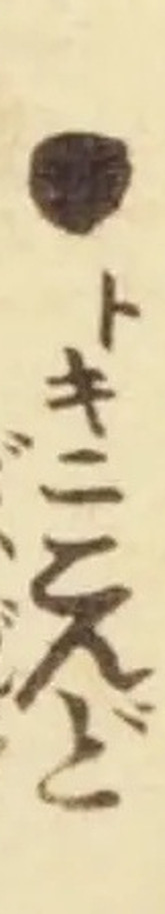●トキニこんど
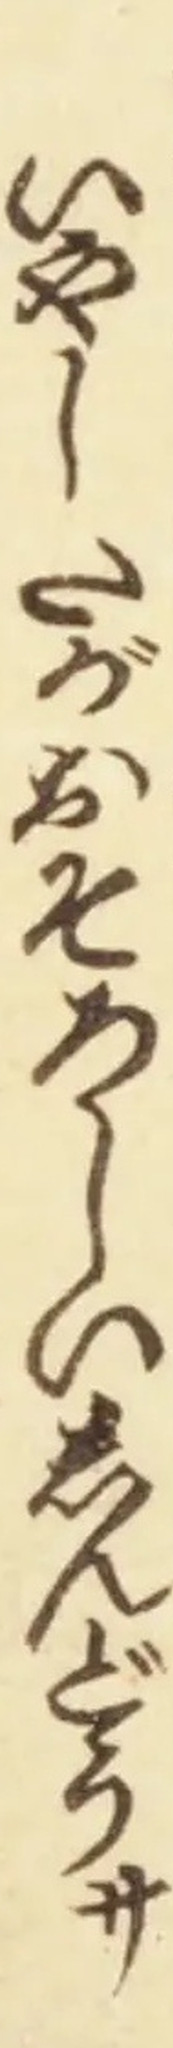いやしたがおそろしいしんどうサ
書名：二日はなし地震亭念魚町々庵炎上
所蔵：国立国会図書館 National Diet Library, JAPAN
